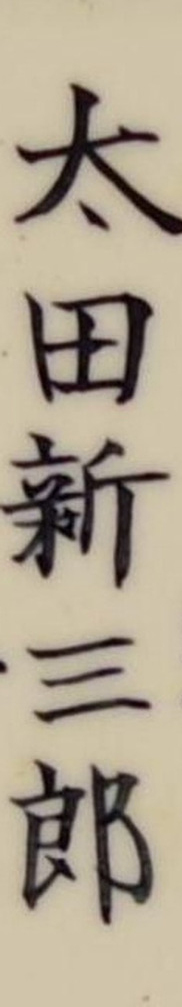太田新三郎
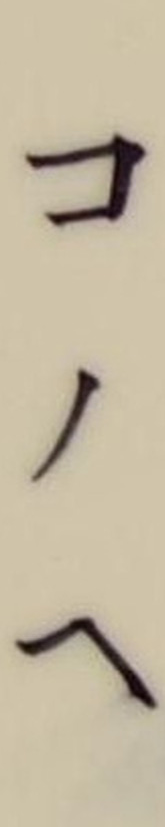コノヘ
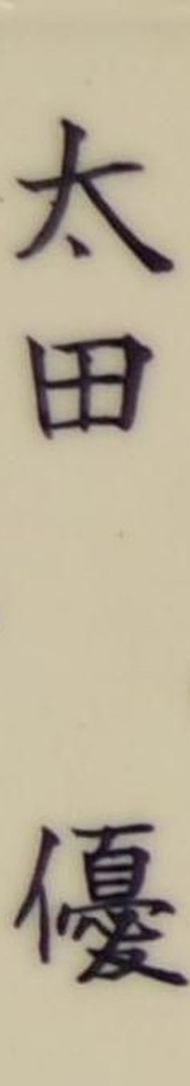太田優
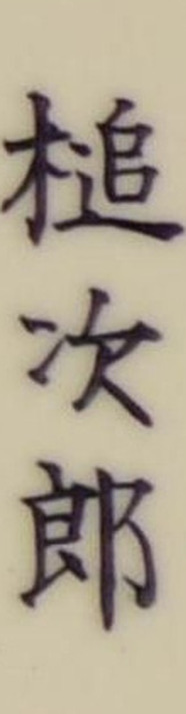槌次郎
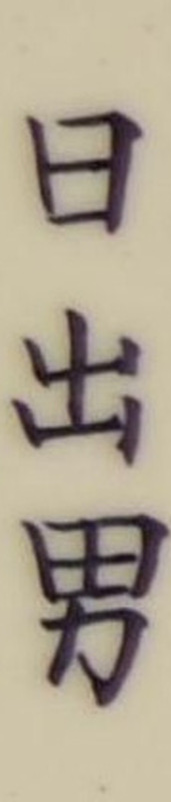日出男

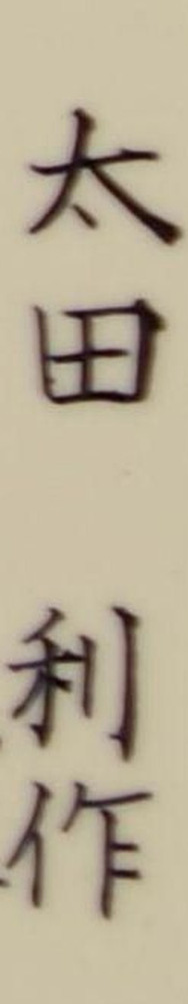太田利作
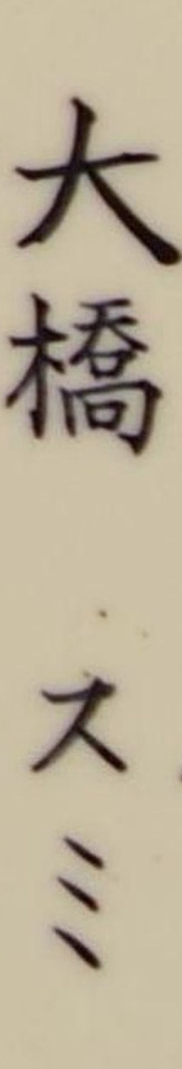大橋スミ
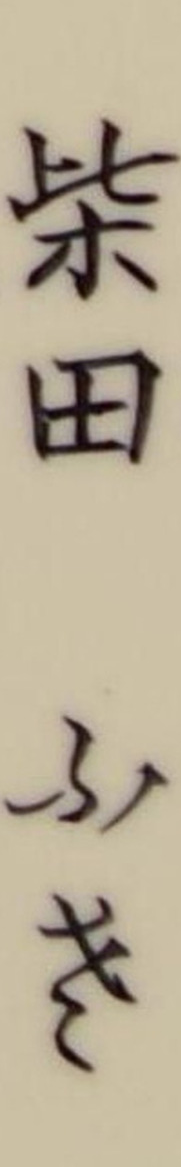柴田ふさ
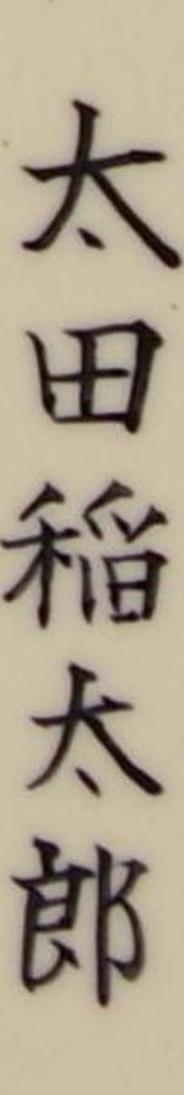太田稲太郎
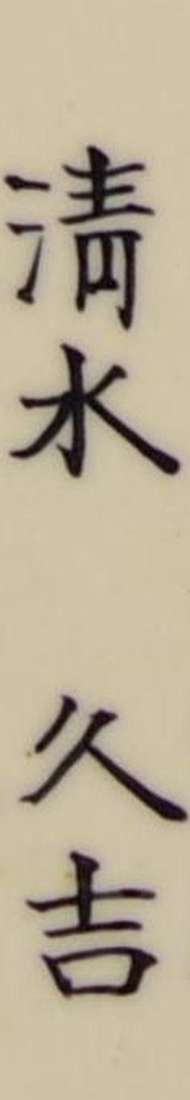清水久吉
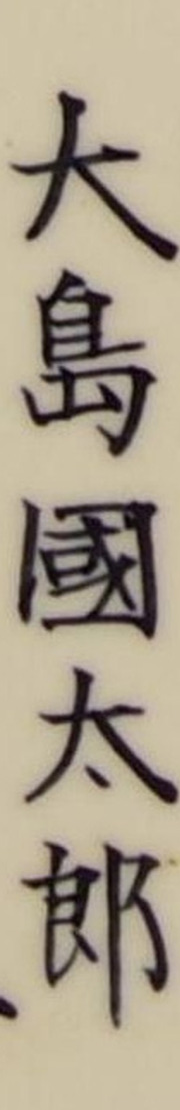大島國太郎
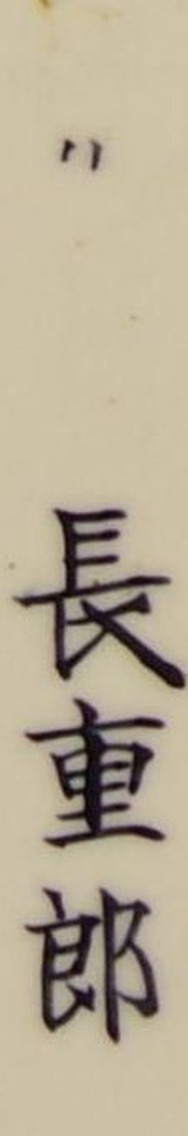長重郎
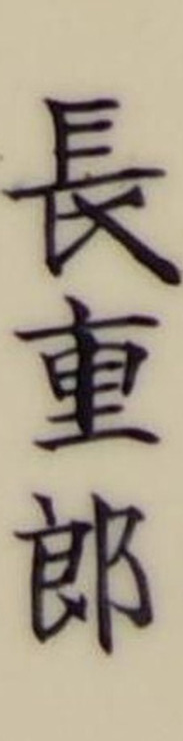長重郎
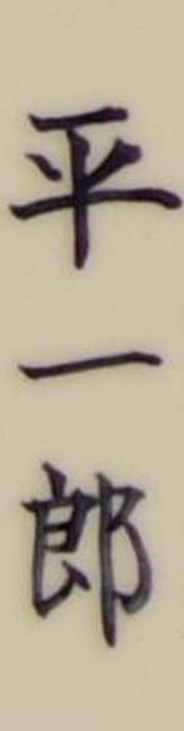平一郎
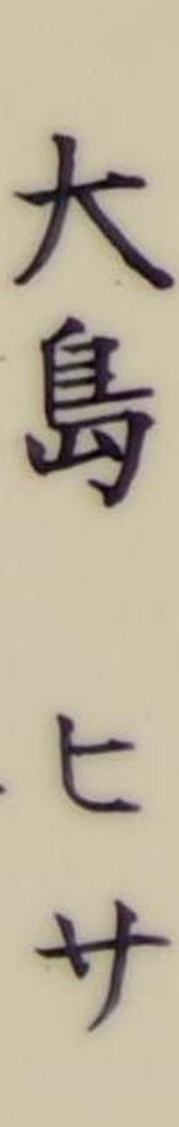大島ヒサ
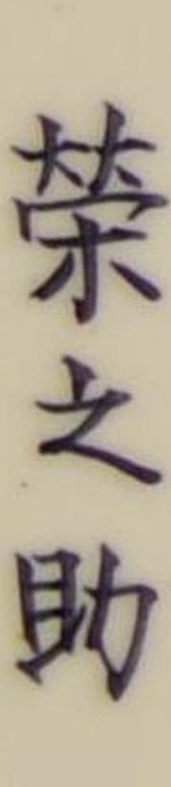榮之助
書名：E~L
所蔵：高野山金剛峯寺
